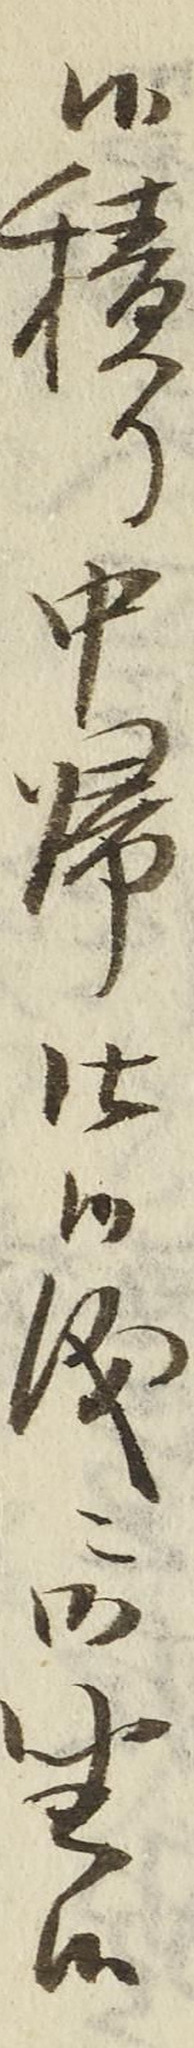候積り以中帰り仕候儀二御座候
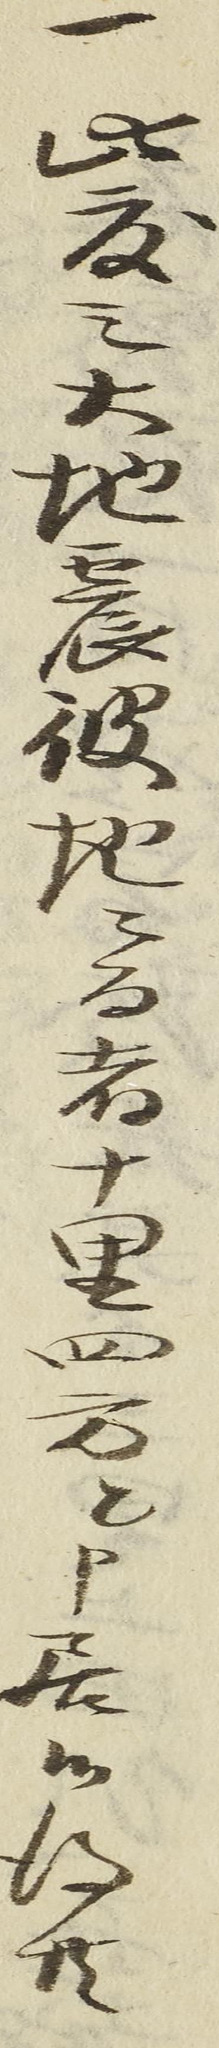一此度之大地震彼地二而は十里四方と申居候得共
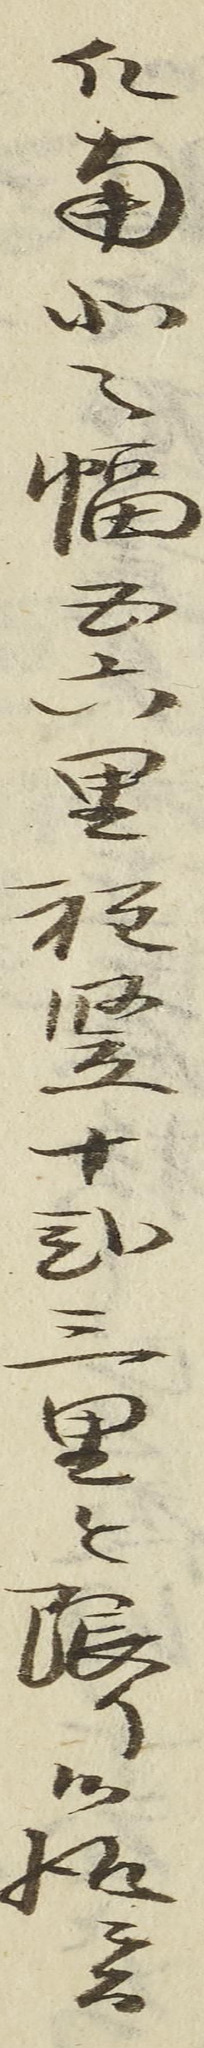凡南北之幅五六里程竪十弐三里を限り候趣二而
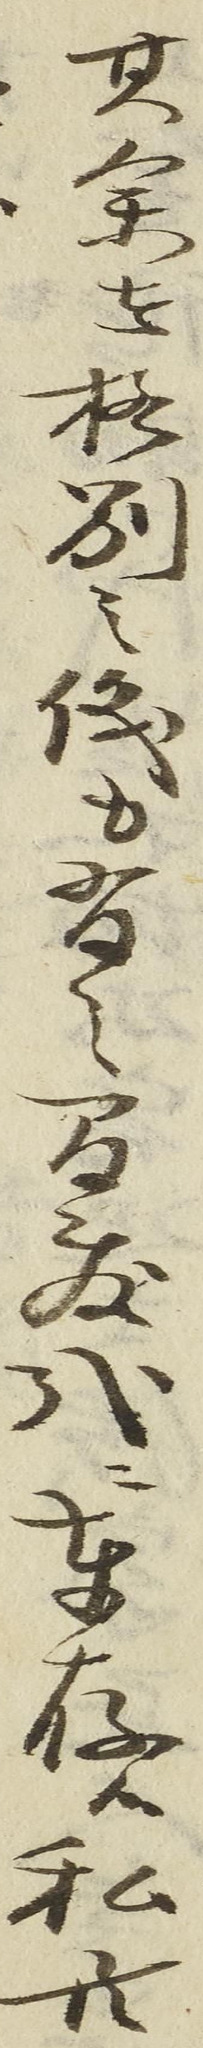其余は格別之儀も有之間敷哉二奉存候私共
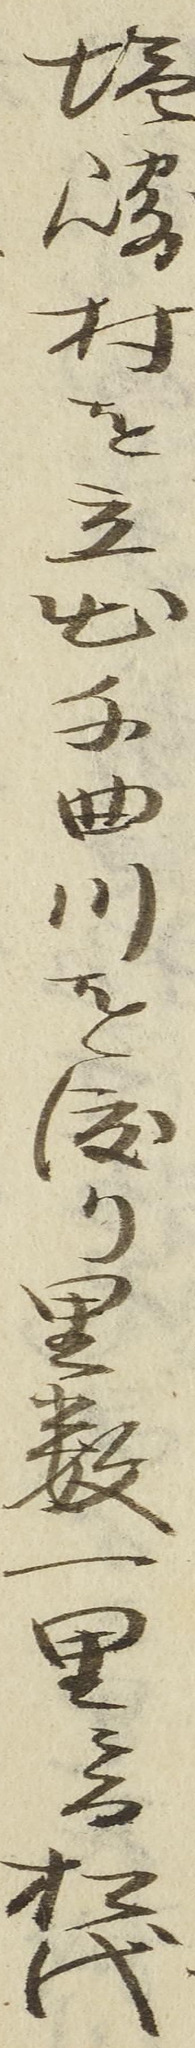塩崎村を立出千曲川を渡り里数壱里二而松代
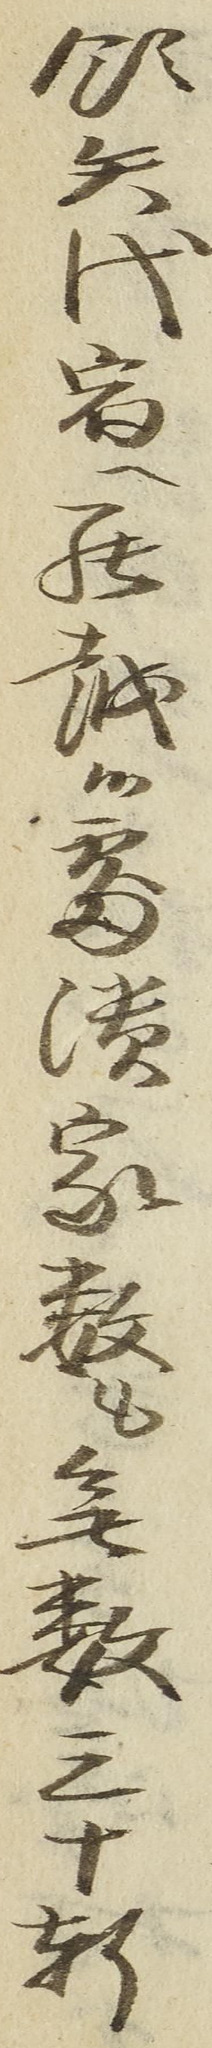領矢代宿へ罷越候処潰家数も無数三十軒

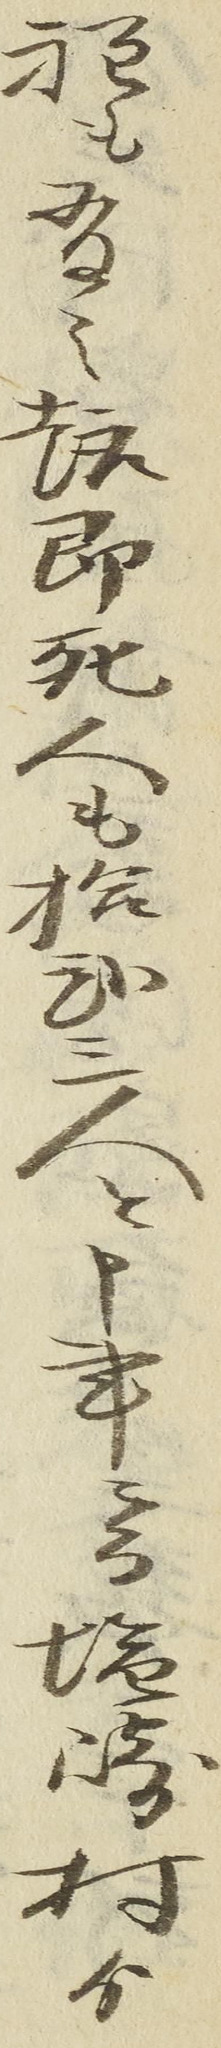程も有之趣即死人も拾弐三人と申事二而塩崎村ゟ
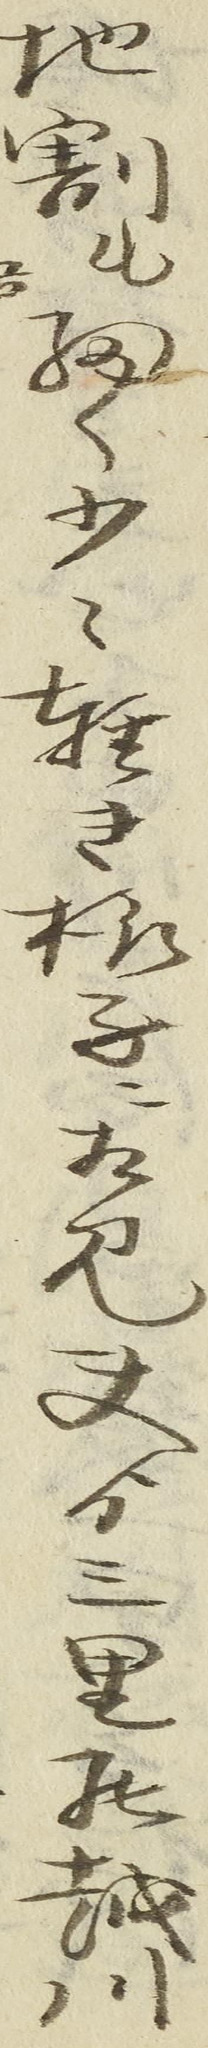地割も細く少々軽キ様子二相見夫ゟ三里罷越川
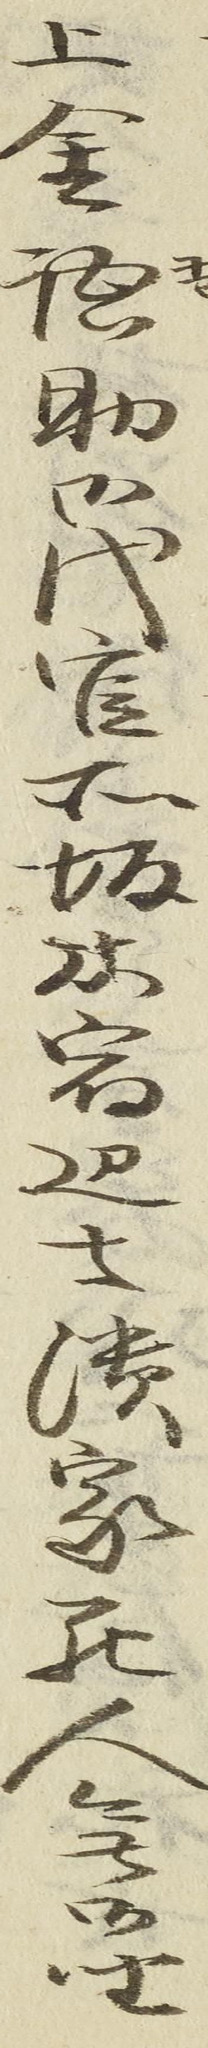上金吾助御代官所坂木宿辺は潰家死人無御坐
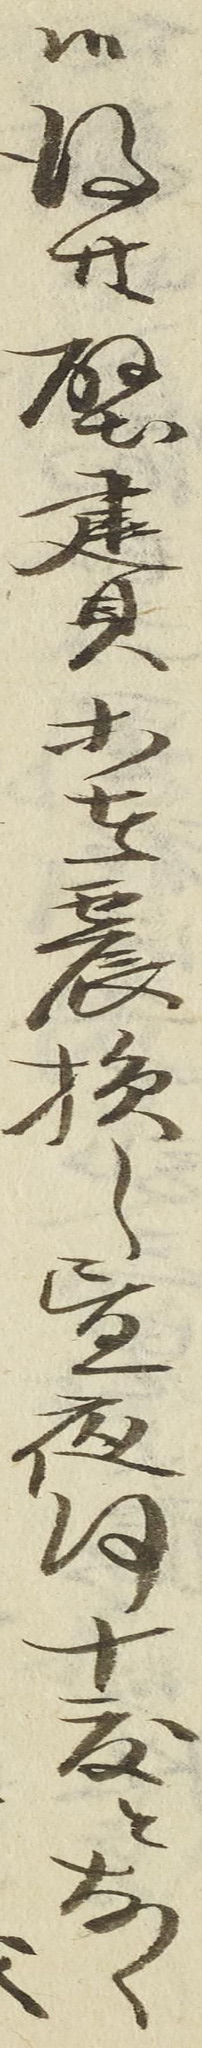候得共壁建具等震損し昼夜何十度となく
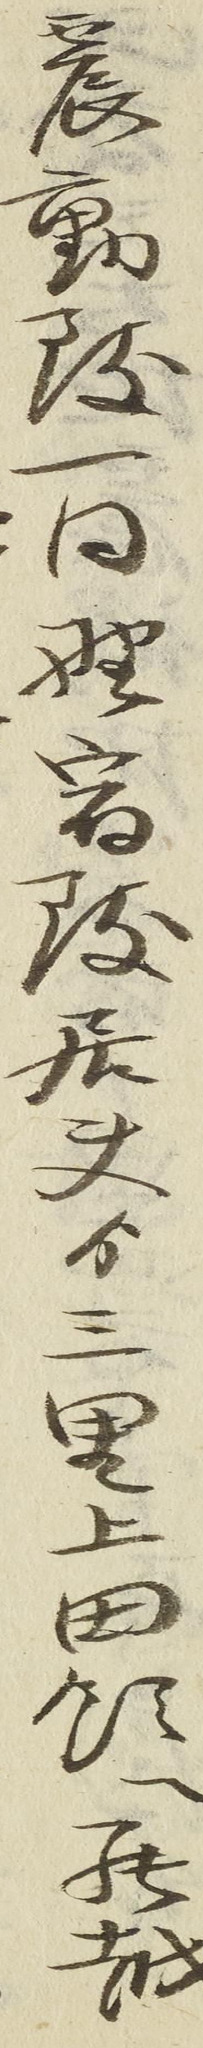震動致一同野宿致居夫ゟ三里上田領へ罷越
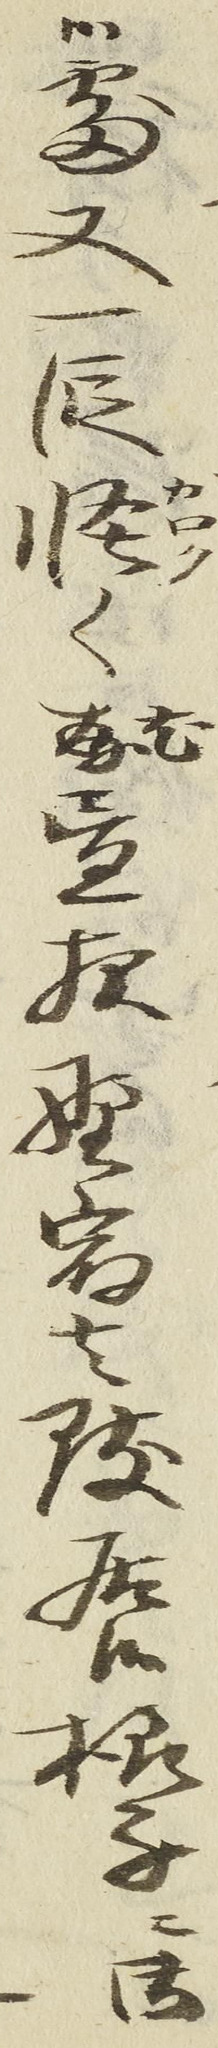候処又一段軽く尤昼夜野宿は致居候様子二御
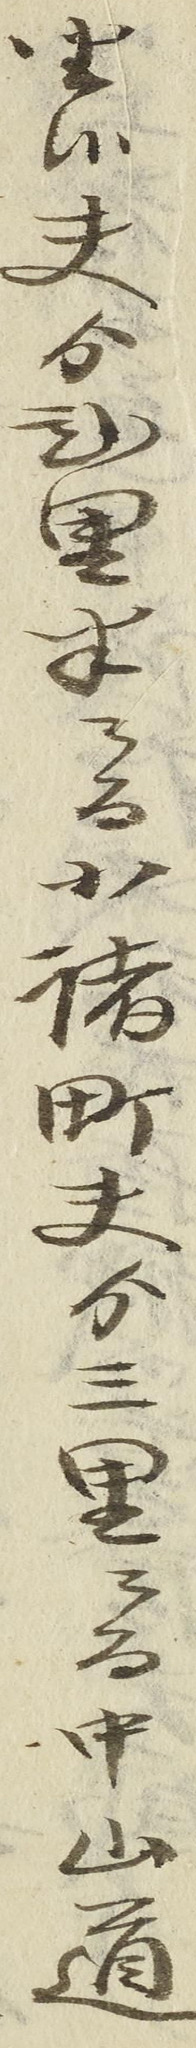坐候夫ゟ弐里半二而小諸町夫ゟ三里二而中山道
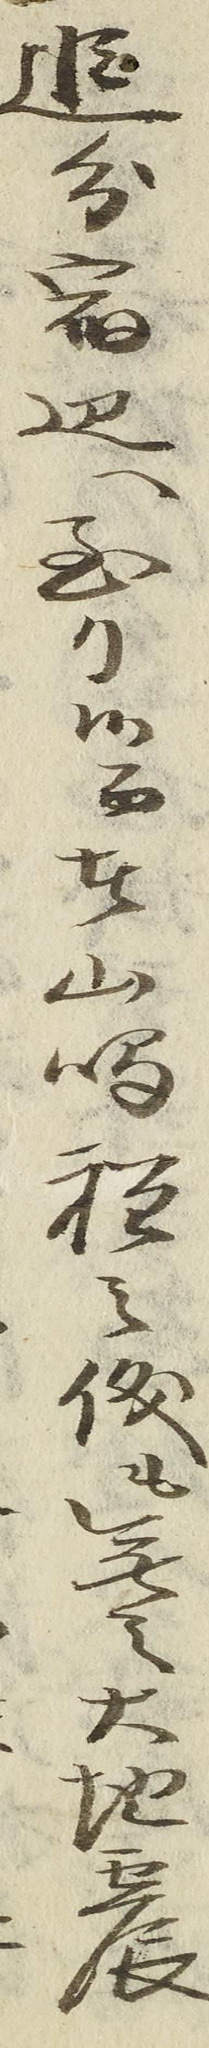追分宿辺へ至り候而は山鳴程之儀も無之大地震
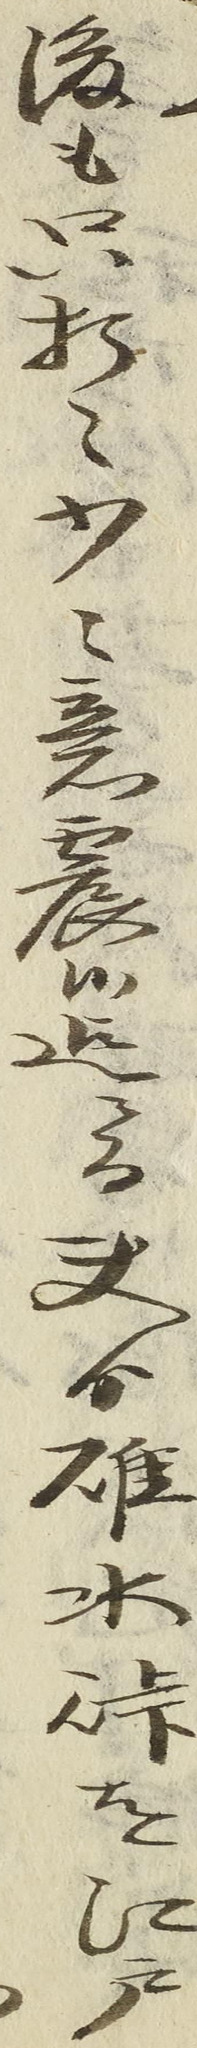後も只折々少々急震候迄二而夫ゟ碓氷峠を江戸
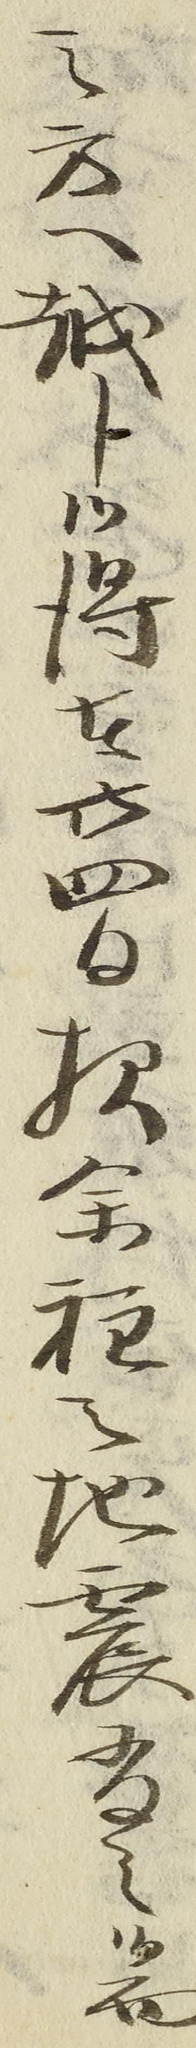之方へ越候得は廿四日夜餘程之地震有之而
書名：信濃國大地震記　乾
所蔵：東京大学地震研究所図書室 Earthquake Research Institute Library, The University of Tokyo, JAPAN
